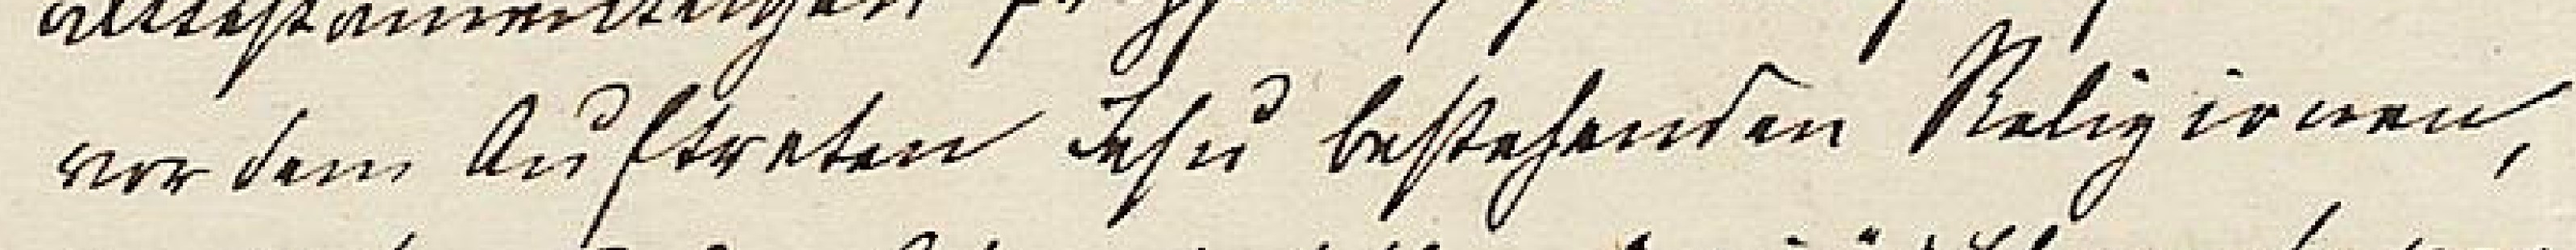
vor dem Auftreten Jesu bestehenden Religionen,
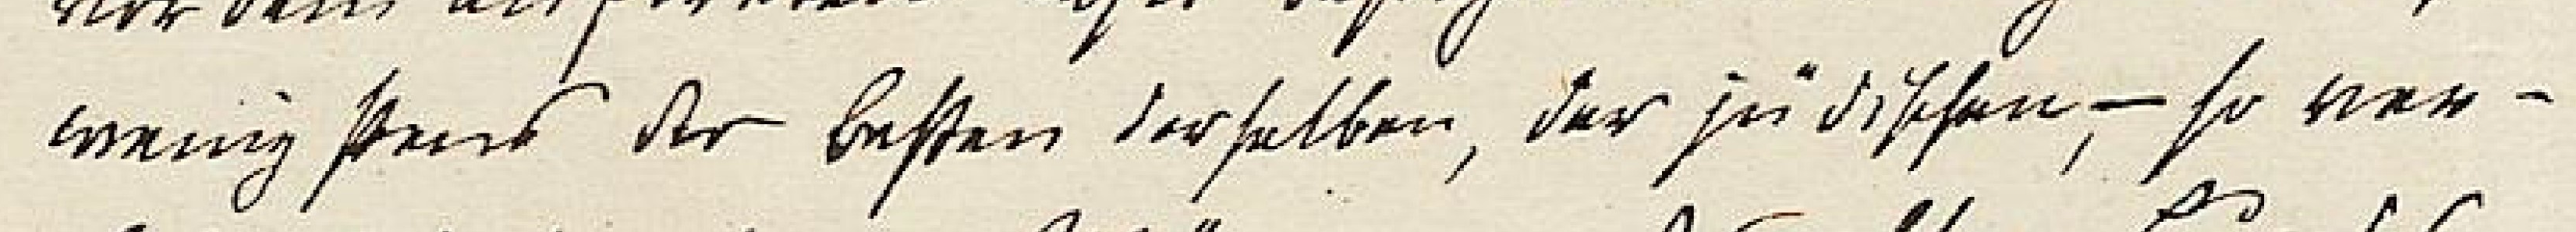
wenigstens der besten derselben, der jüdischen,- so ver¬
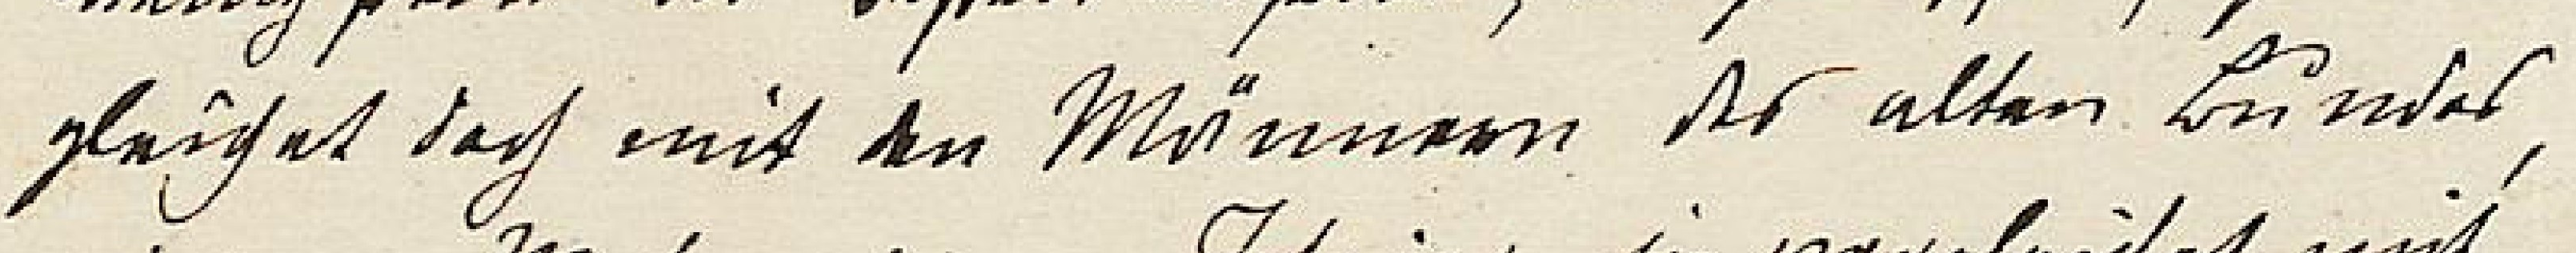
gleichet doch mit den Männern des alten Bundes
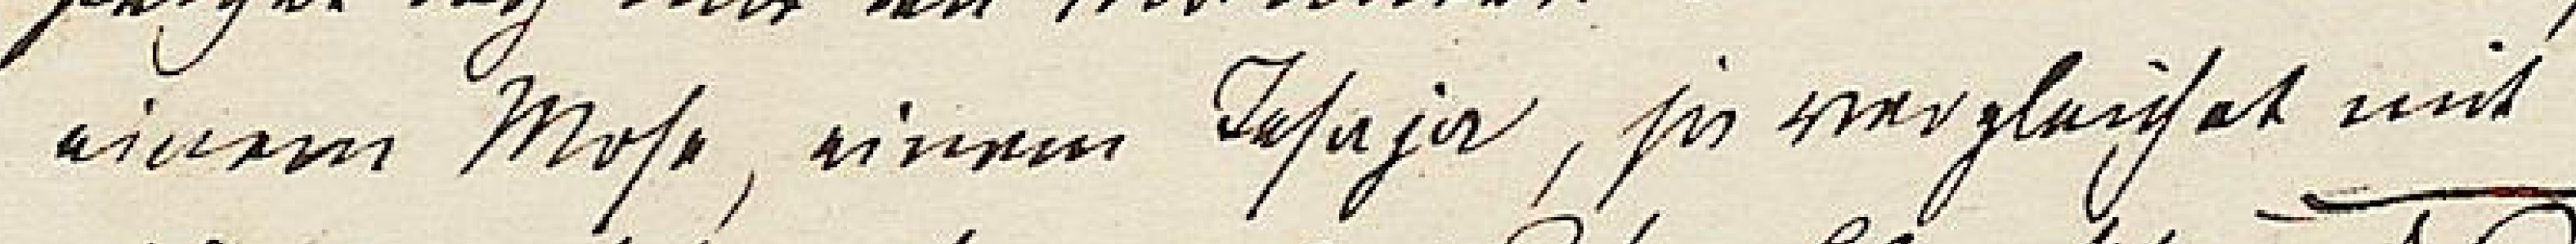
einen Mose, einen Jesaja, ja vergleichet mit
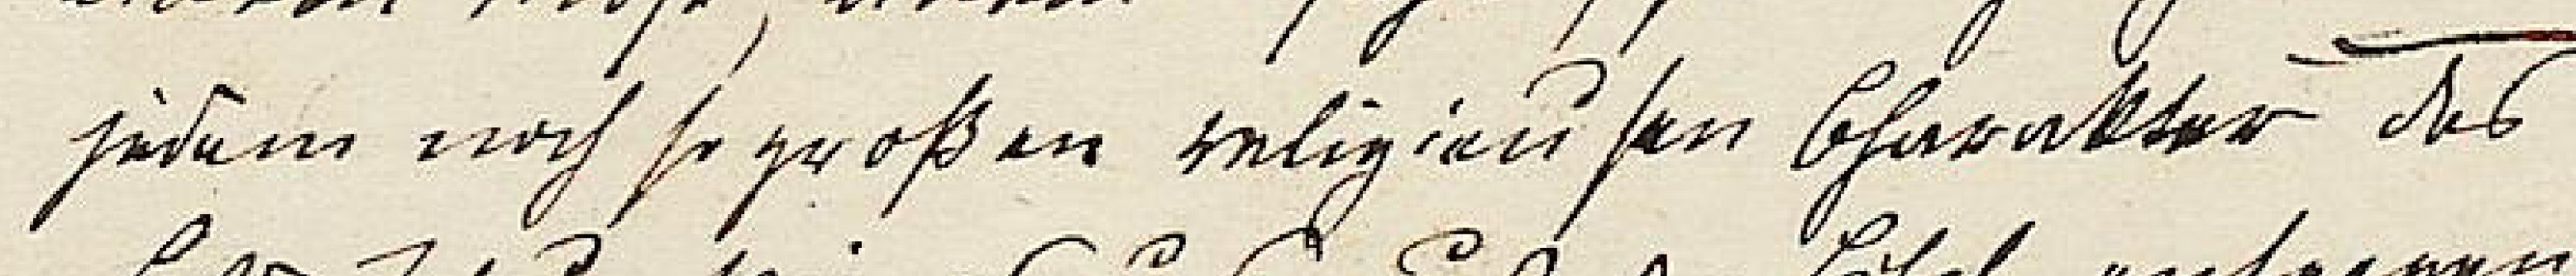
jedem noch so großen religieusn Chrakter das
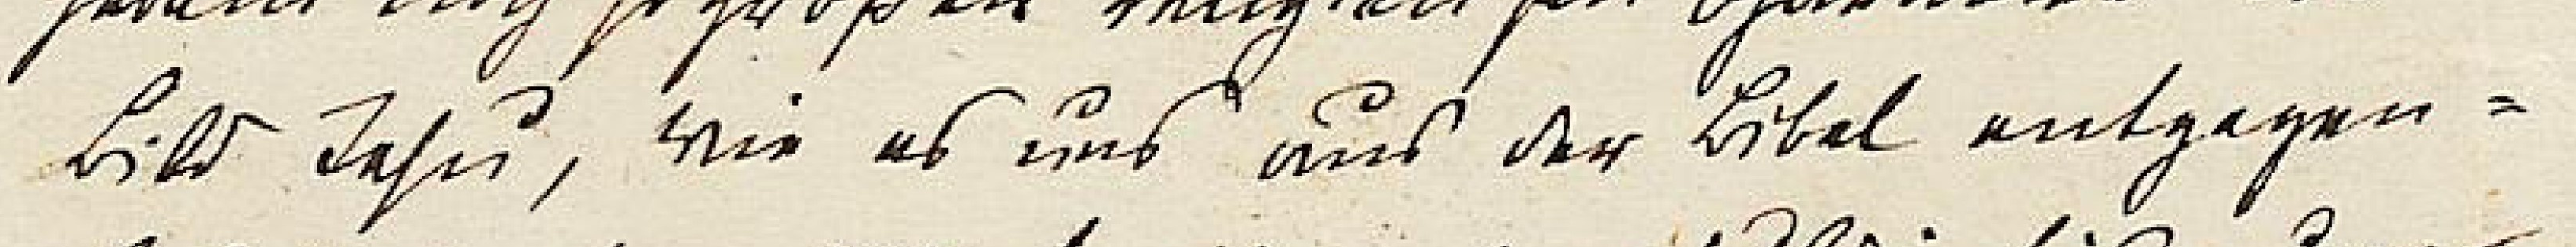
Bild Jesu, wie es uns aus der Bibel entgegen¬
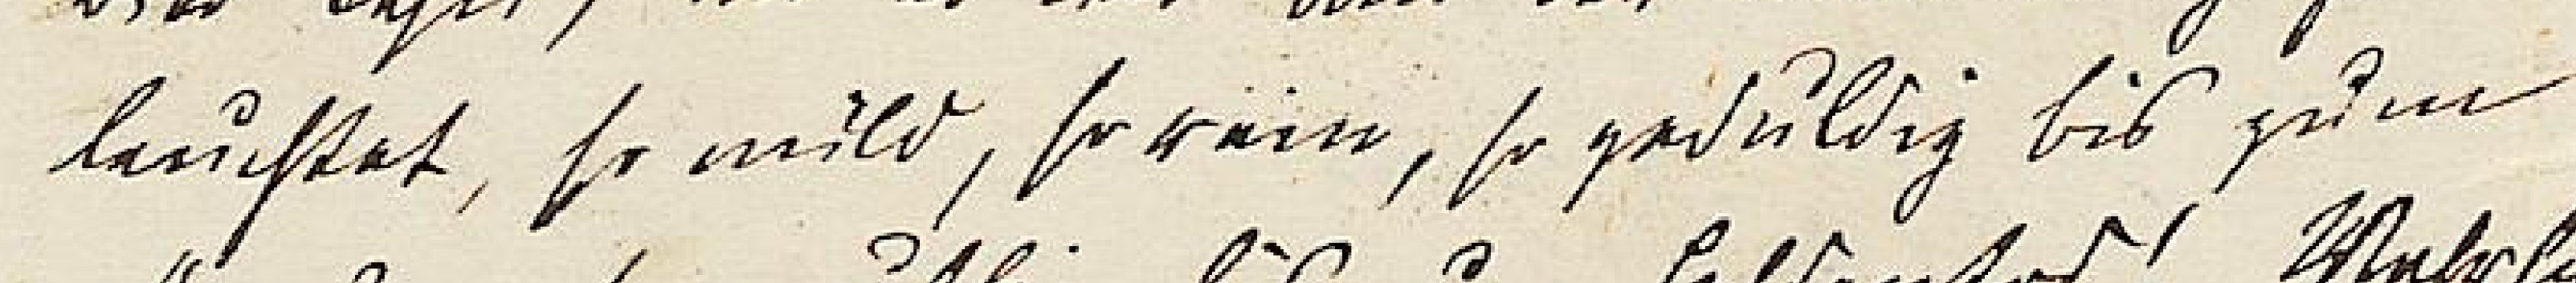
leuchtet, so mild, so rein, so geduldig bis zum
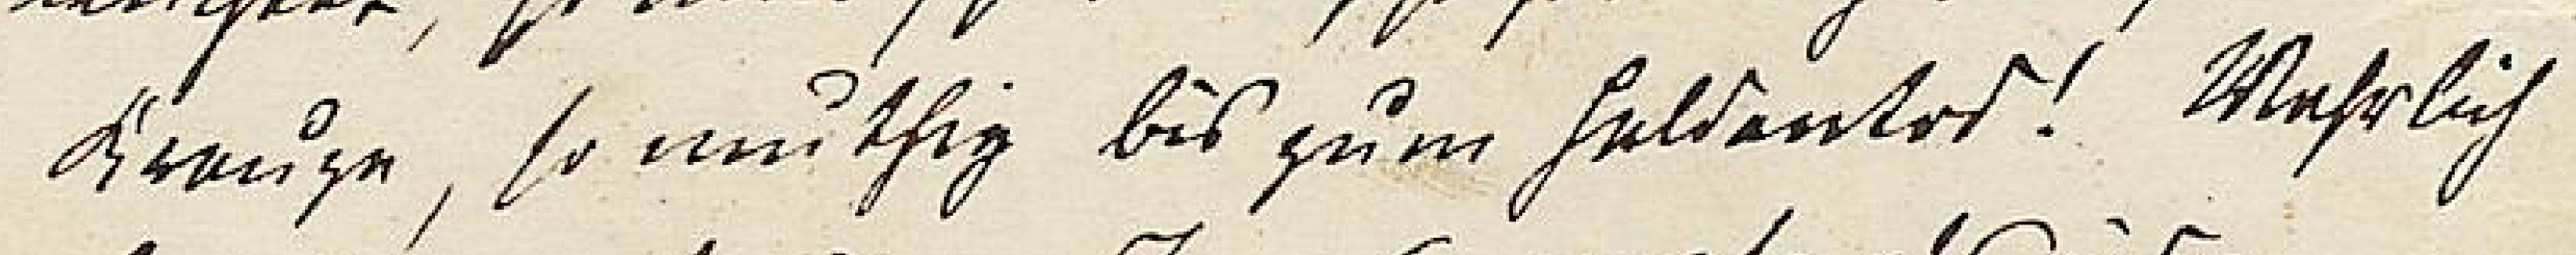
Kreuze, so muthig bis zum Heldentod! Warhlich
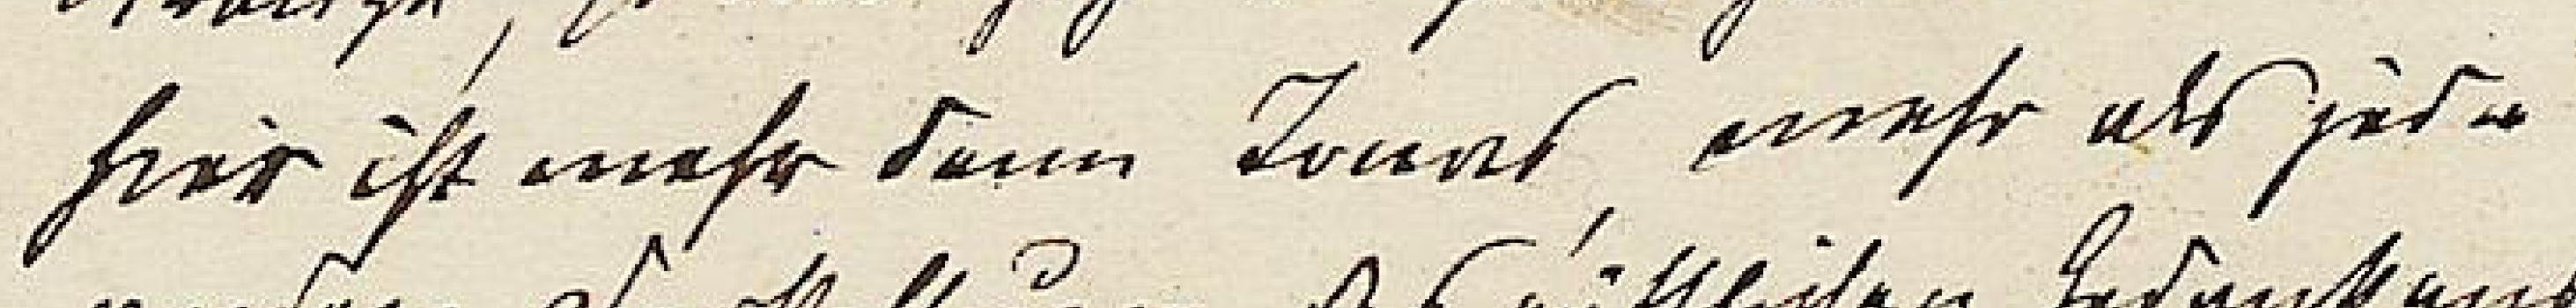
hier ist mehr denn Jonas, mehr als jede
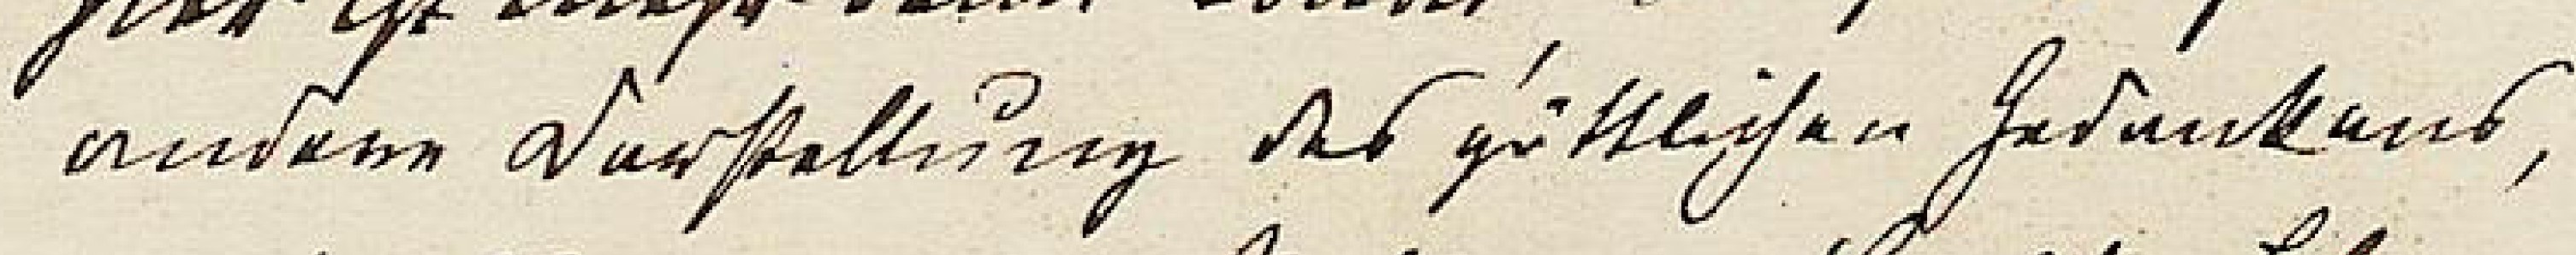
andere Darstellung des göttlichen Gedenkens,
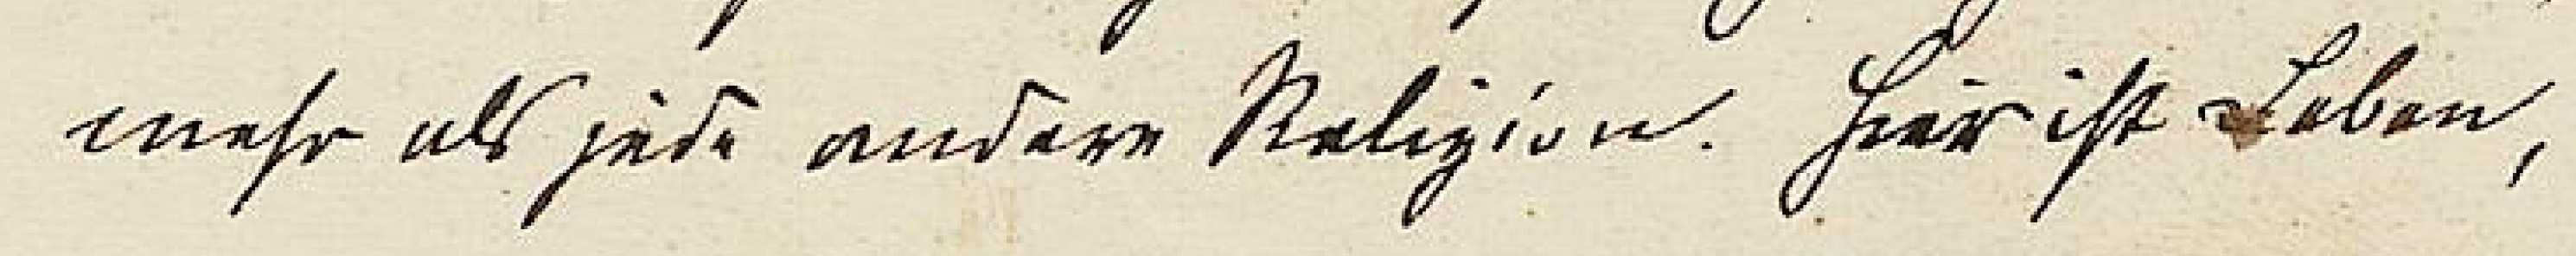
mehr als jede andere Religion. Hier ist Leben,
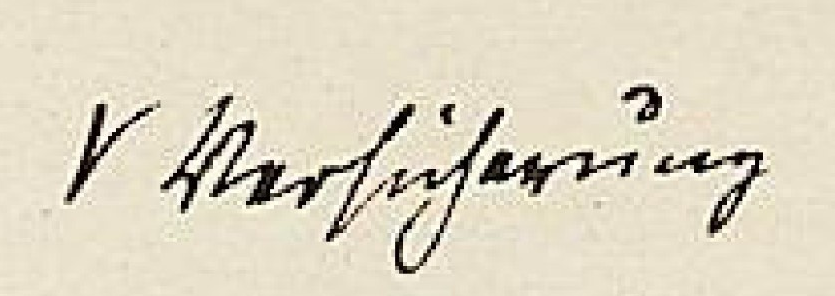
V Versicherung
